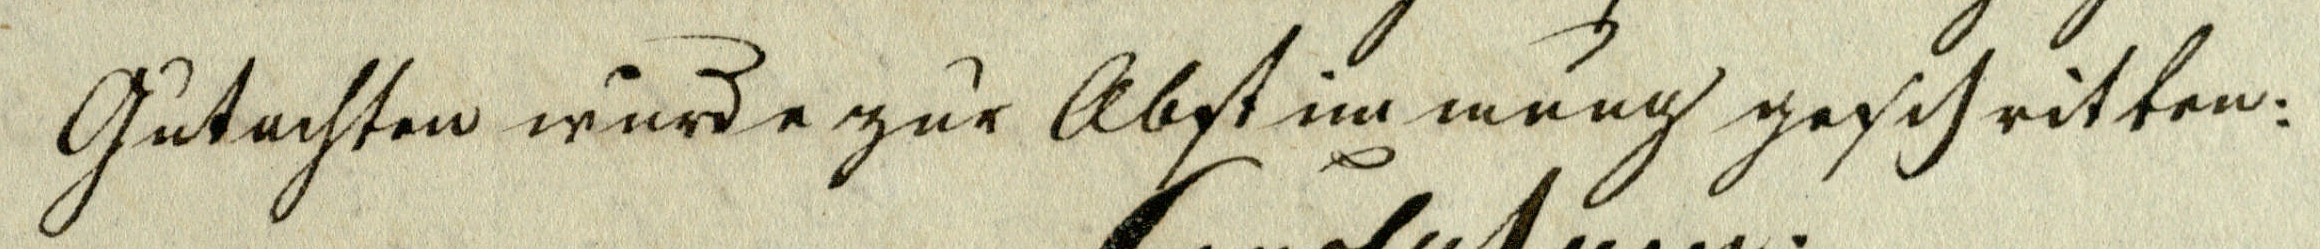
Gutachten wurde zur Abstimmung geschritten:
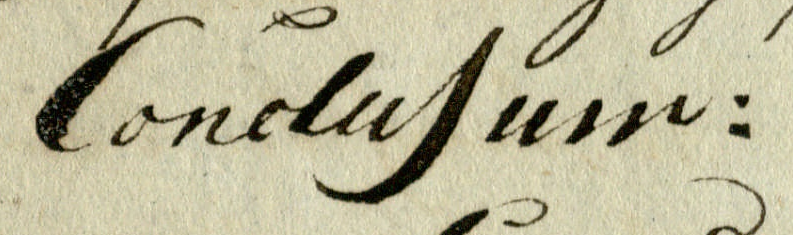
Conclusum:
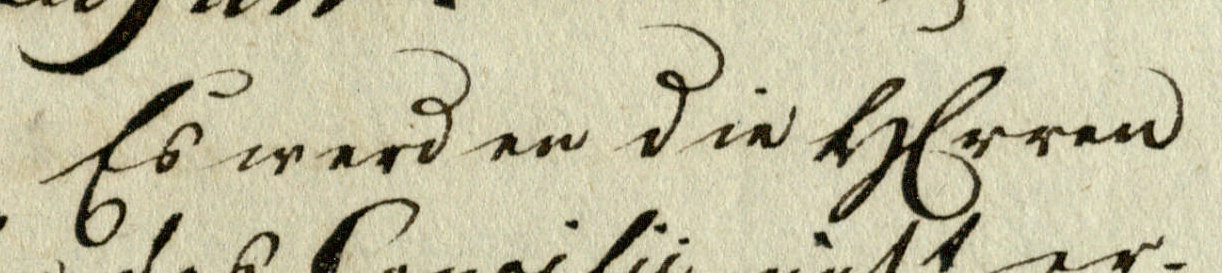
Es werden die Herren
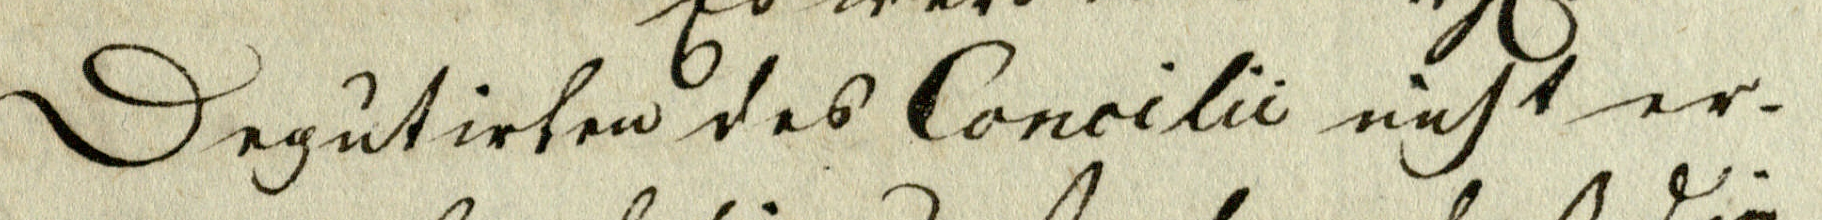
Deputirten des Concilii nicht er¬
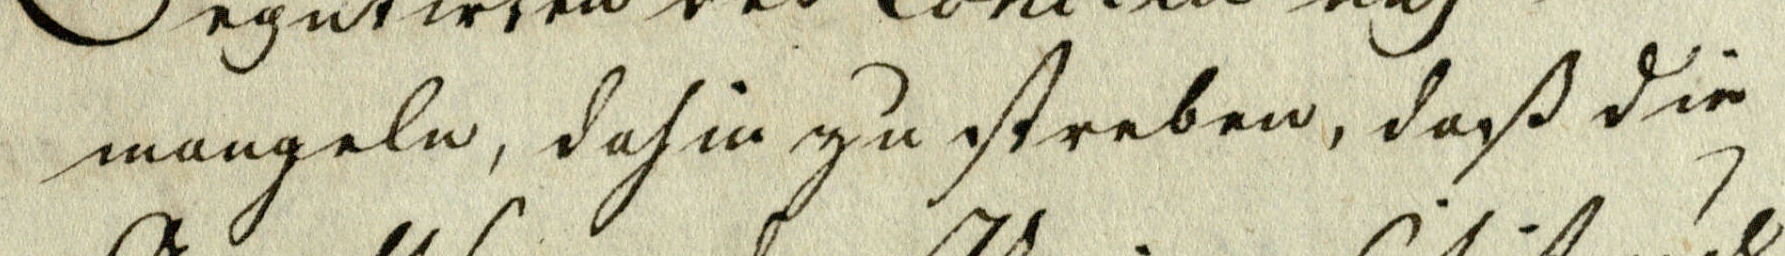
mangeln, dahin zu streben, daß die
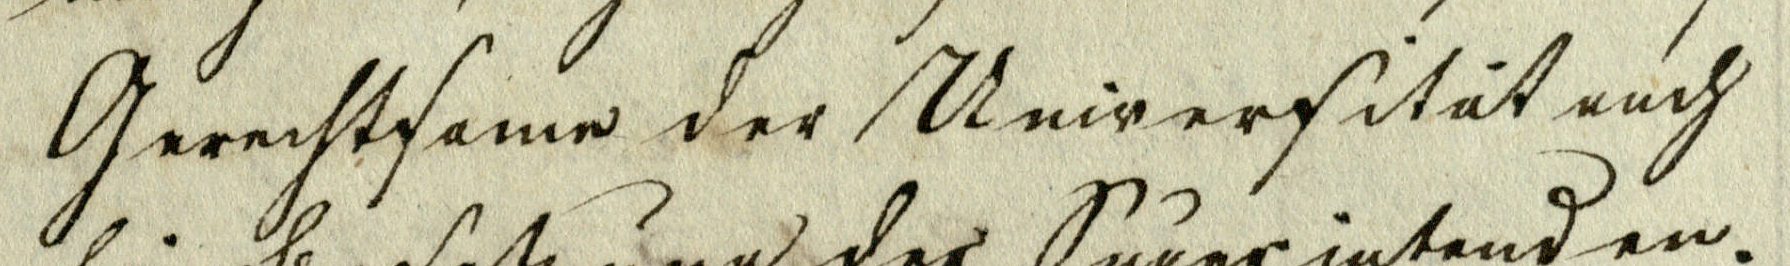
Gerechtsame der Universität auch
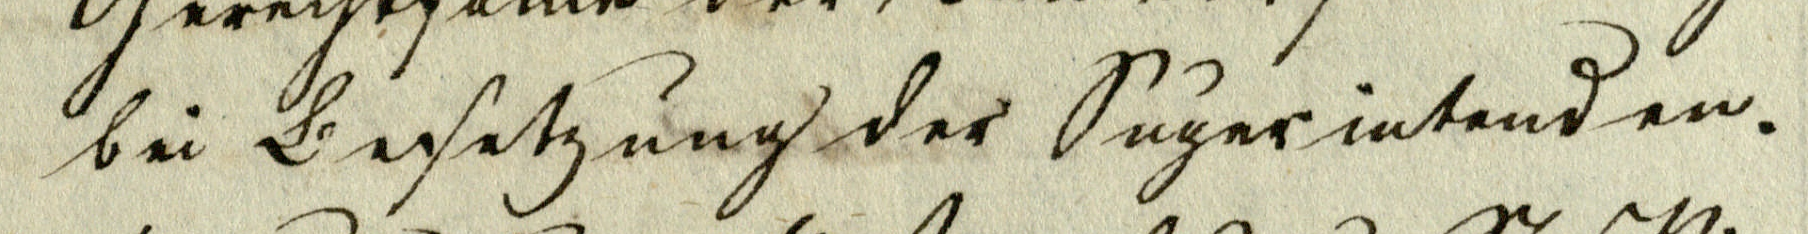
bei Besetzung der Superintenden¬
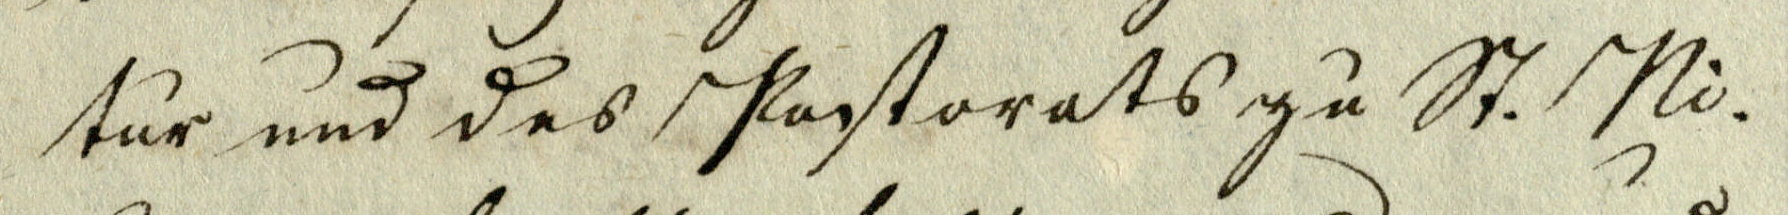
tur und des Pastorats zu St. Ni¬
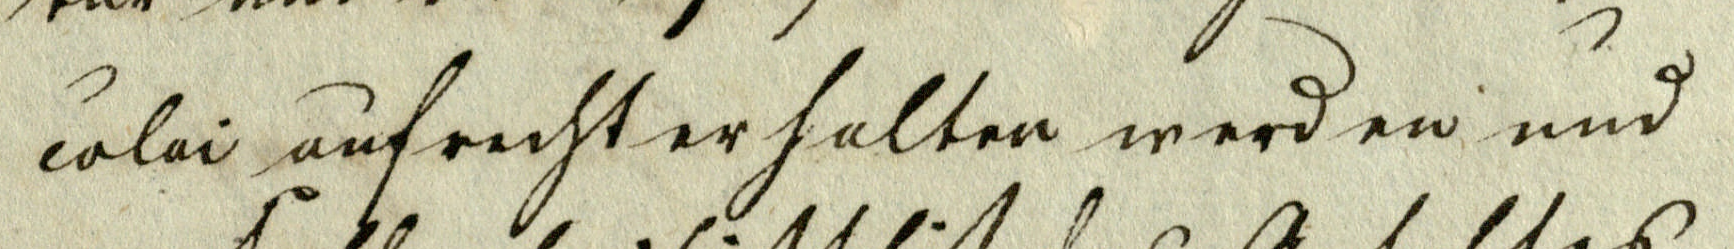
colai aufrecht erhalten werden und
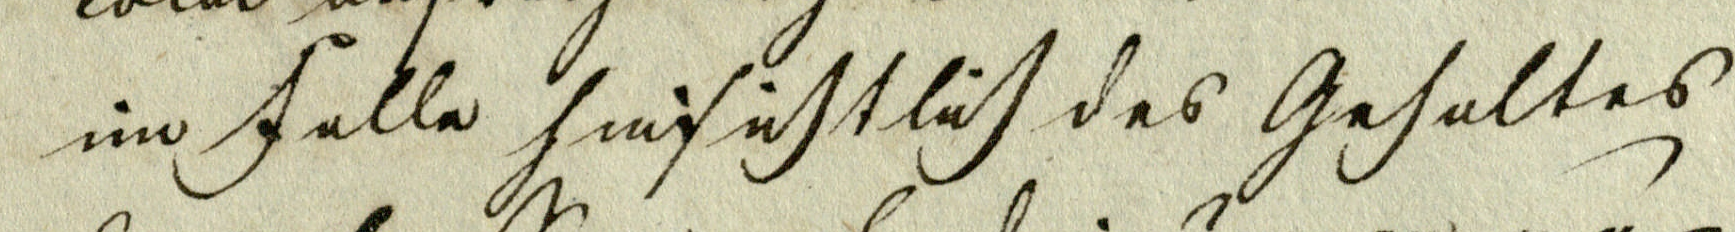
im Falle hinsichtlich des Gehaltes
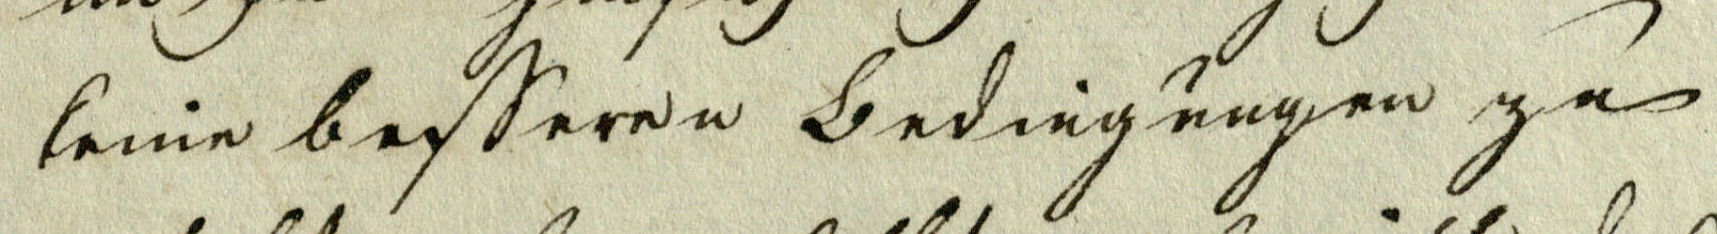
keine besseren Bedingungen zu
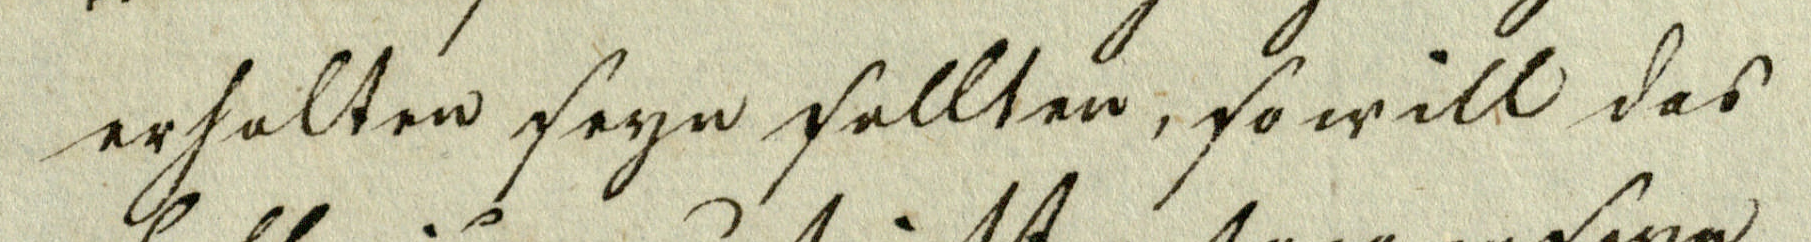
erhalten seyn sollten, so will das
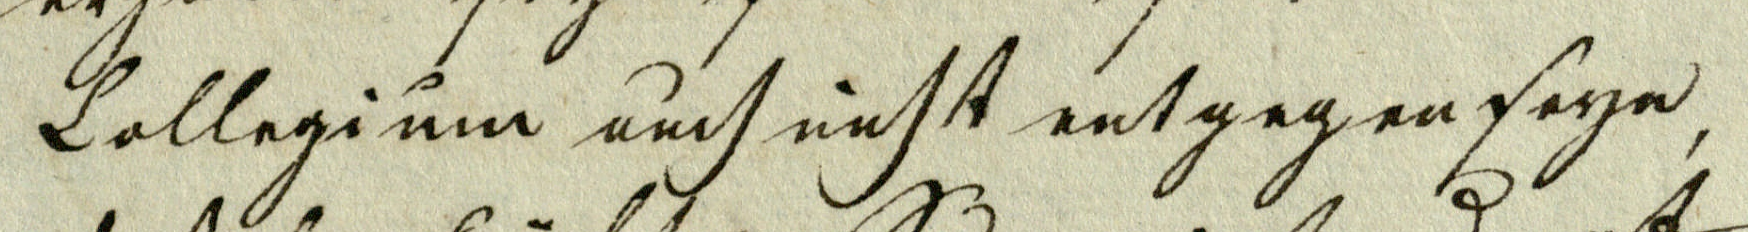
Collegium auch nicht entgegen seyn,
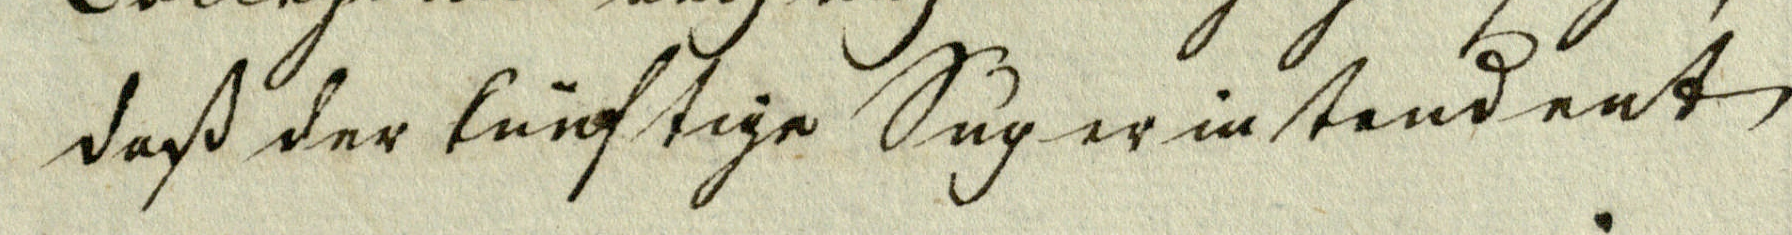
daß der künftige Superintendent
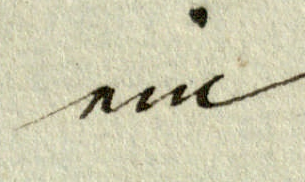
ein
